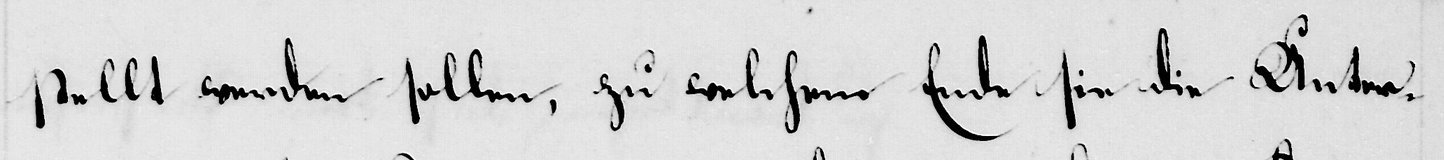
stellt werden sollen, zu welchem Ende sie die Unter¬
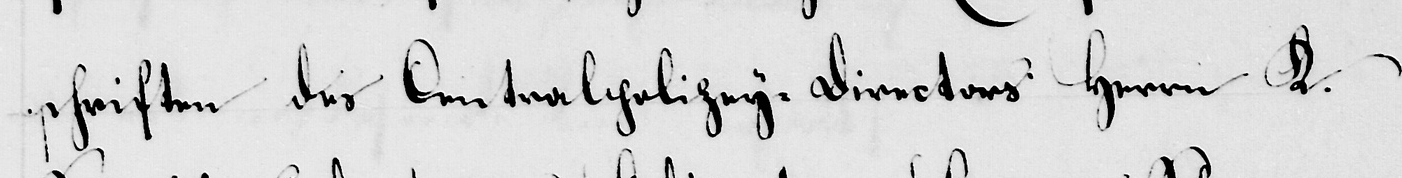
schriften des Cantonalpolizey-Directors Herrn K.
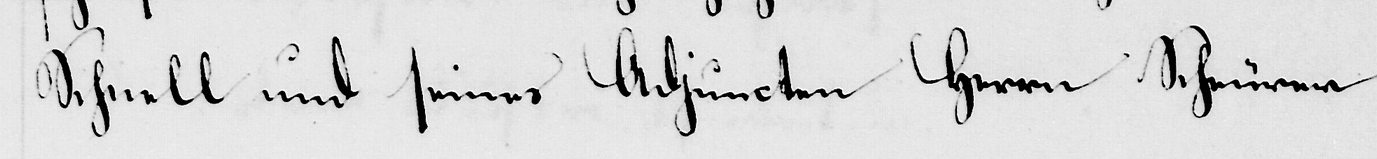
Schnell und seines Adjuncten Herrn Scheurer
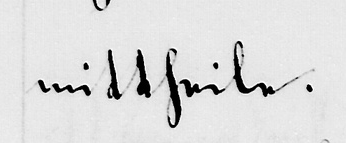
mittheile.
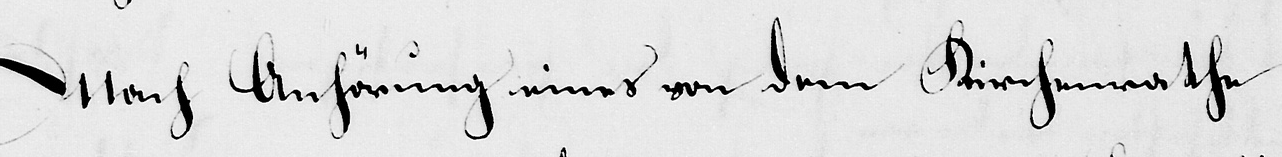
Nach Anhörung eines von dem Kirchenrathe
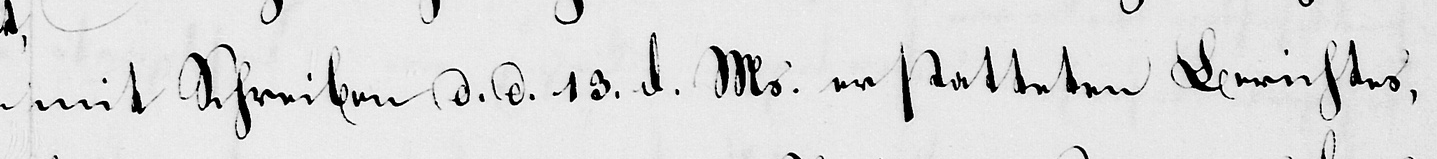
mit Schreiben d. d. 13. d. Ms. erstatteten Berichtes,
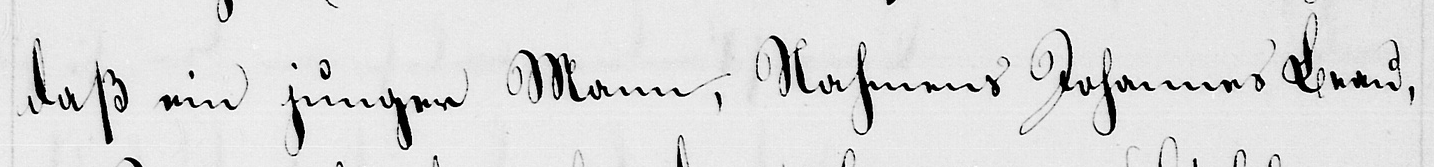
daß ein junger Mann, Nahmens Johannes Beau,
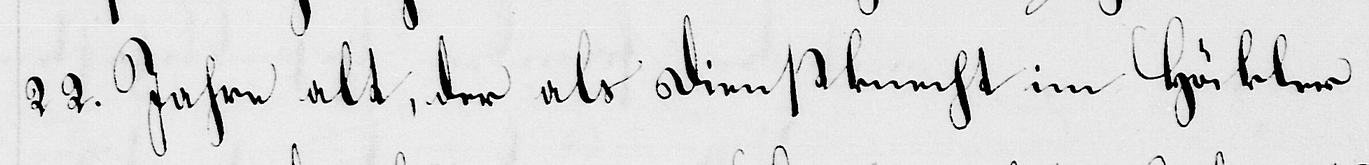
22. Jahre alt, der als Dienstknecht im Häkler
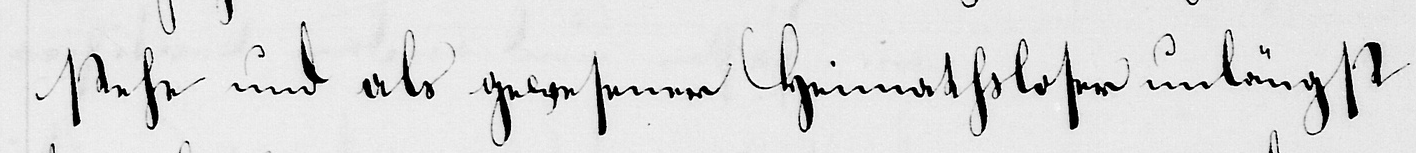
stehe und als gewesener Heimathsloser unlängst
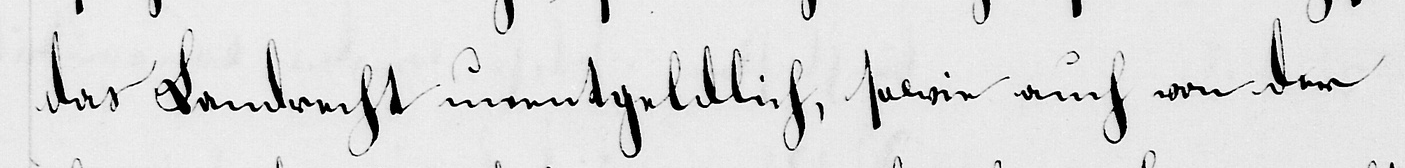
das Landrecht unentgeldlich, sowie auch von der
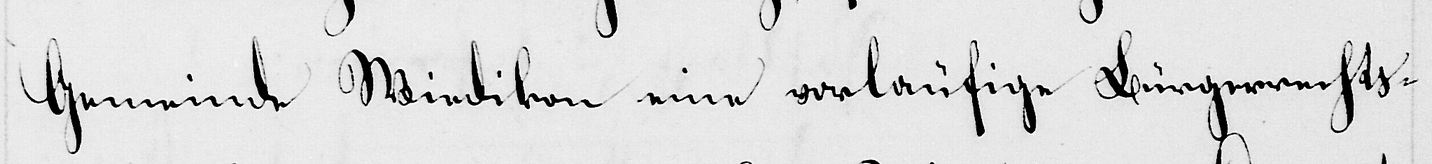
Gemeinde Wiedikon eine vorläufige Bürgerrecht¬
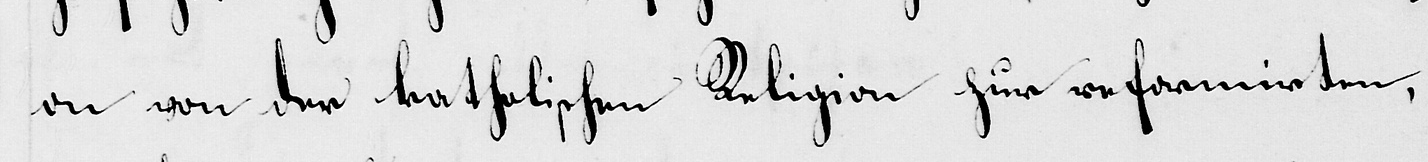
on von der katholischen Religion zur reformierten,
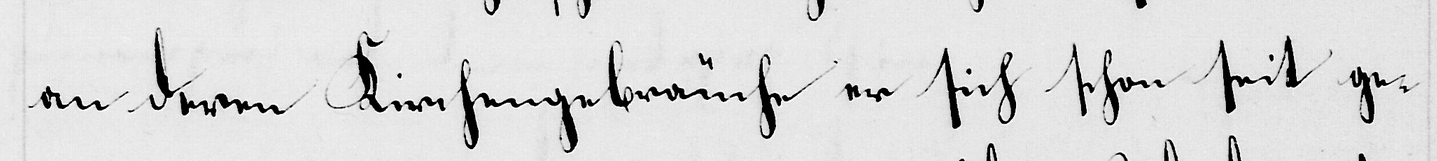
an deren Kirchengebräuche er sich schon seit ge¬
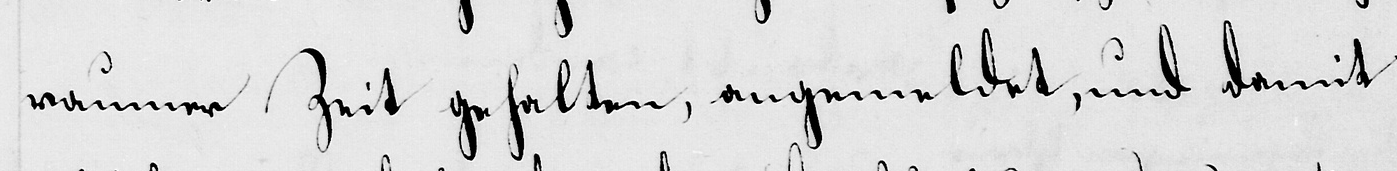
raumer Zeit gehalten, angemeldet, und damit
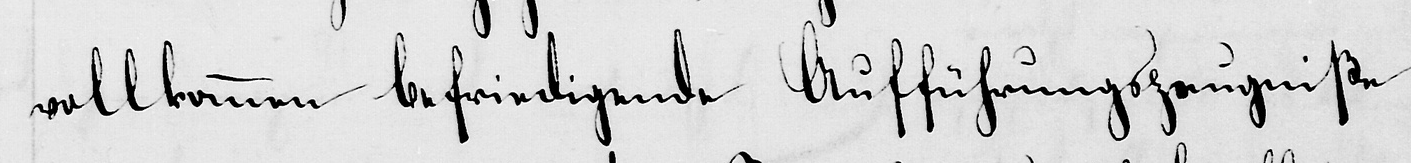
vollkommen befriedigende Aufführungszeugniße
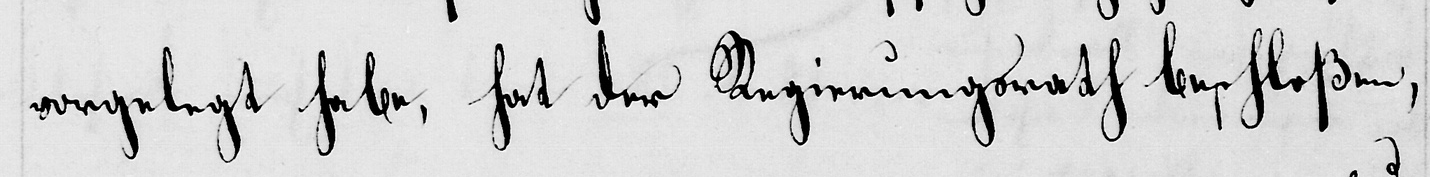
vorgelegt habe, hat der Regierungsrath beschloßen,
